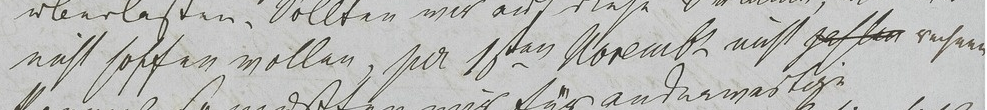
nicht hoffen wollen, per 1sten Novembr nicht zahlen rechnen
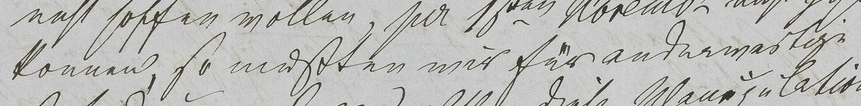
können, so müßten wir für anderweitige
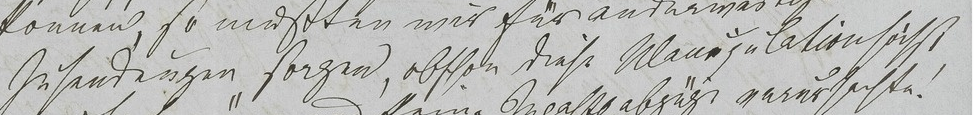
Zusendungen sorgen, obschon diese Manipulation höchst
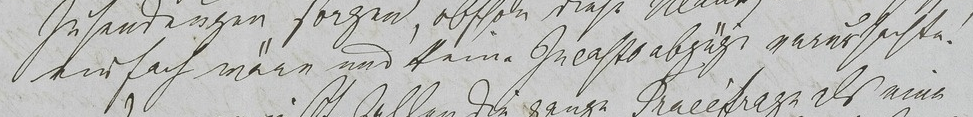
einfach wäre und keine Incassoabzüge verursachte!
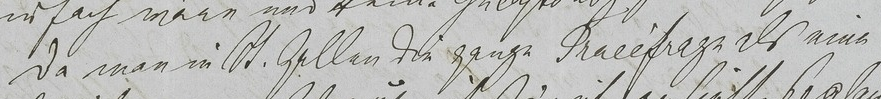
Da man in St. Gallen die ganze Tracéfrage als eine
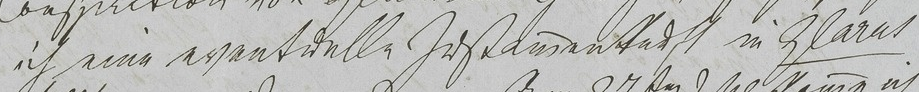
ich eine eventuelle Zusammenkunft in Glarus
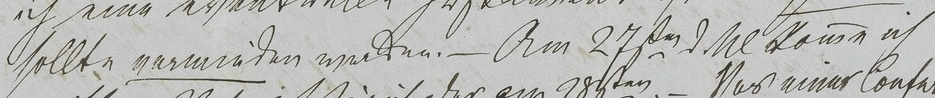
sollte vermieden werden. – Am 27sten d. M komme ich
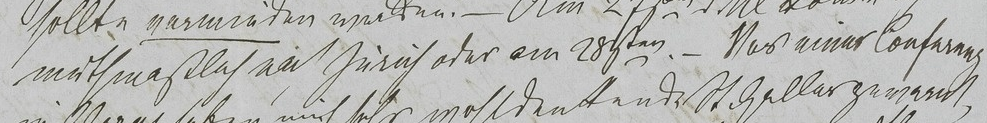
muthmaßlich nach Zürich oder am 28sten. – Vor einer Conferenz
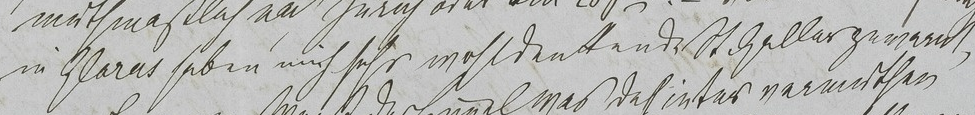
in Glarus haben mich sehr wohldenkende St.Galler gewarnt,
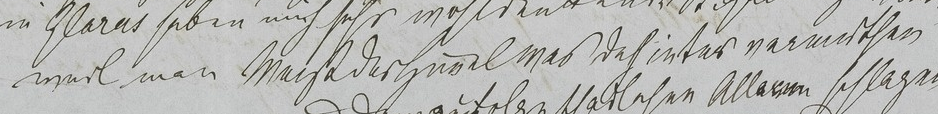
weil man Weiß der Himmel was dahinter vermuthen
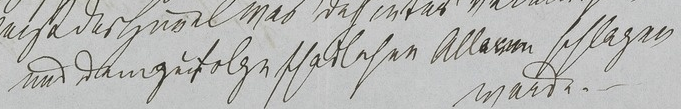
und demzufolge schädlichen Allarm schlagen
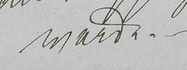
würde.
